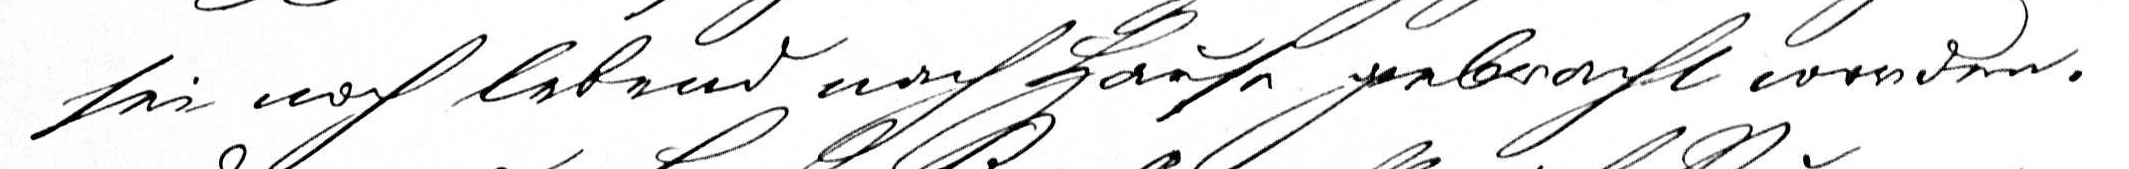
sei noch lebend nach Hause gebracht werden.
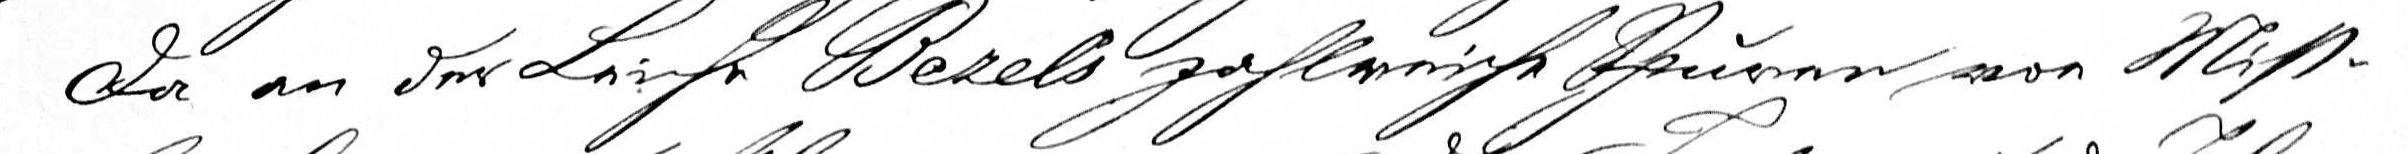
Da an der Leiche Bezel’s zahlreiche Spuren von Miß¬
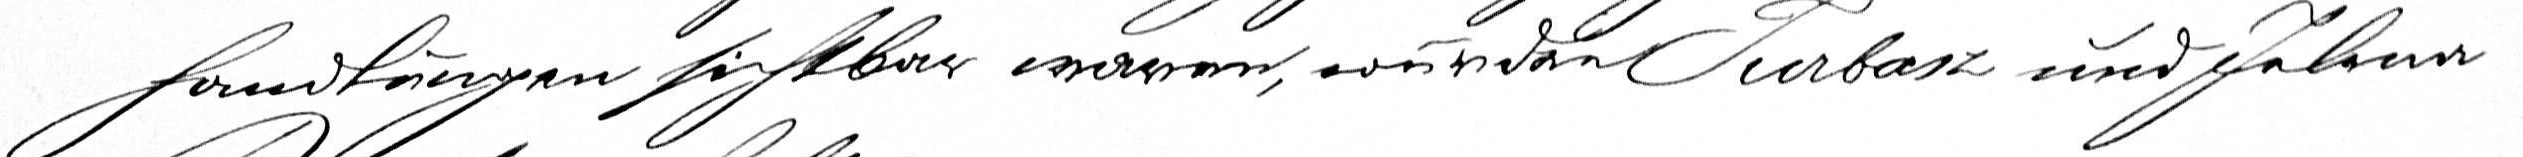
handlungen sichtbar waren, wurden Iurbasz und Jelena
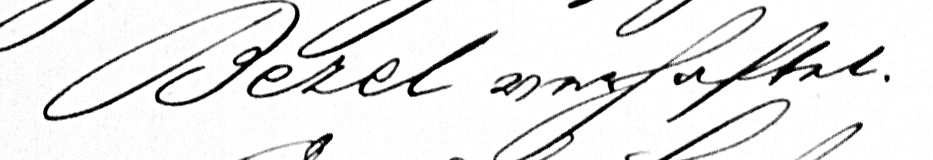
Bezel verhaftet.
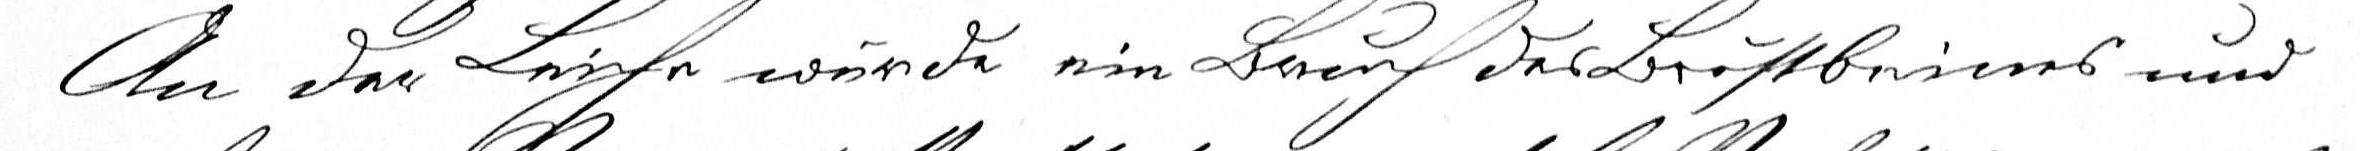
An der Leiche wurde ein Bruch des Brustbeines und
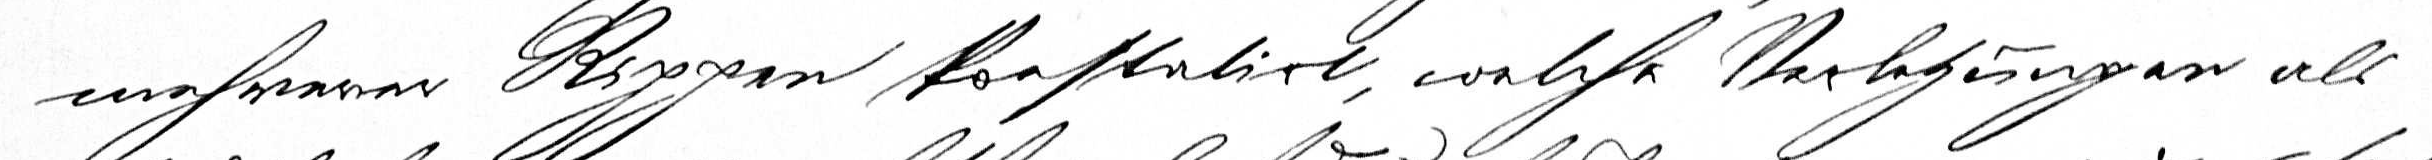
mehrerer Rippen konstatirt, welche Verletzungen als
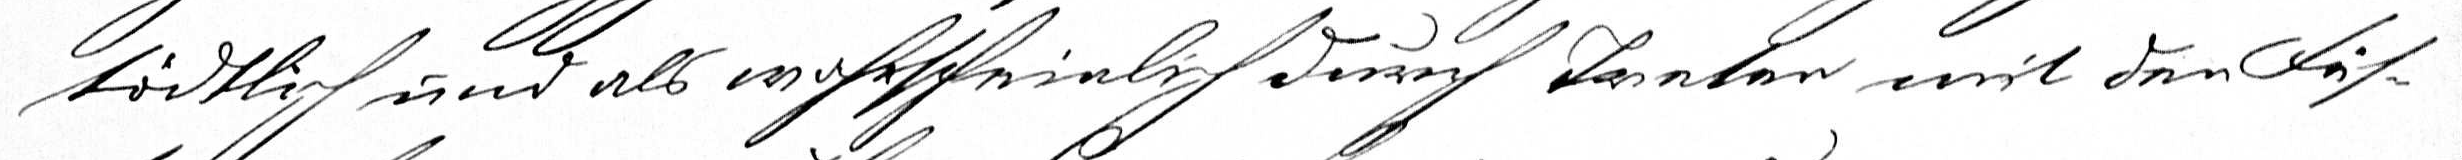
tödtlich und als wahrscheinlich durch treten mit den Füs¬
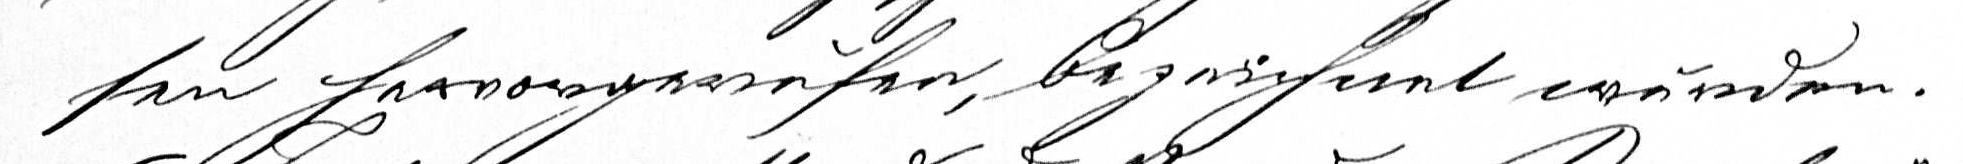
sen hervorgerufen, bezeichnet werden.
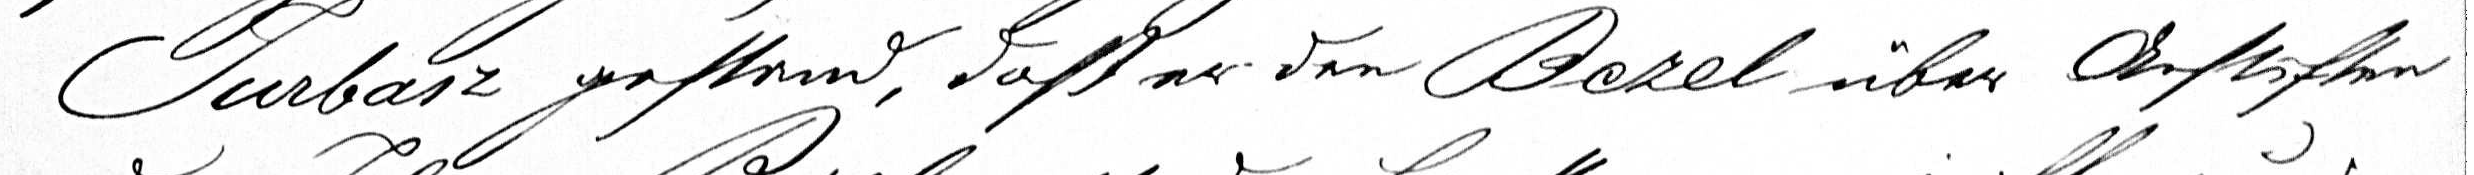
Iurbasz gestand, daß er den Bezel über Anstiften
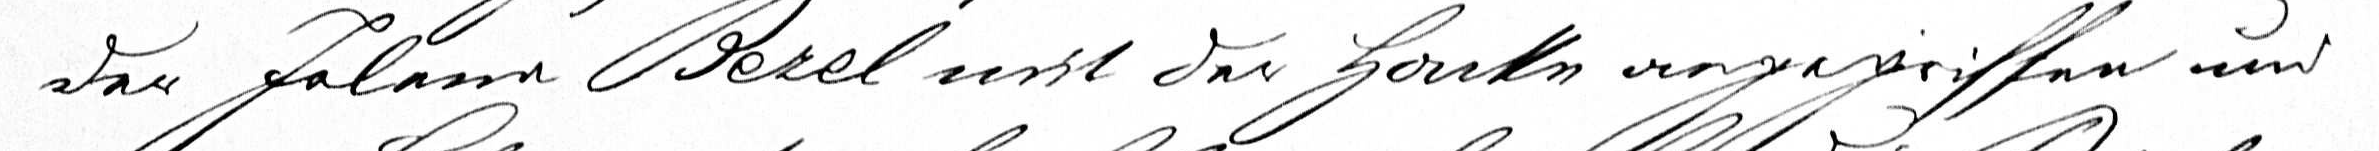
der Jelena Bezel mit der Hacke angegriffen und
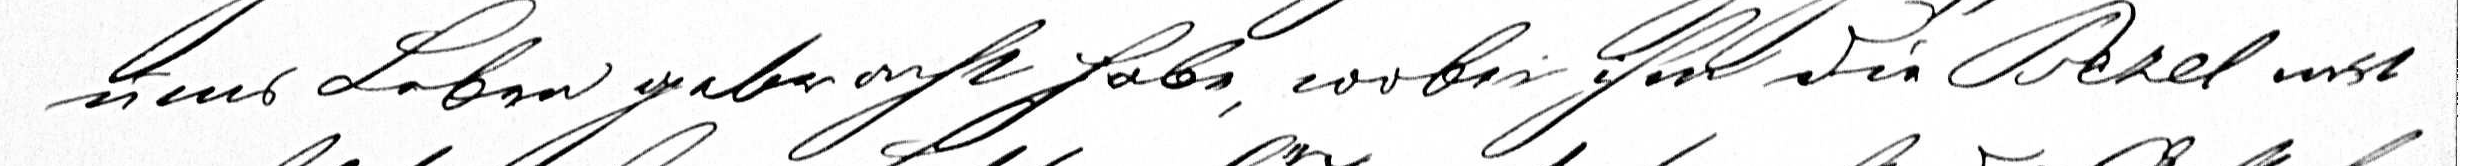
ums Leben gebracht habe, wobei ihm die Bezel mit¬
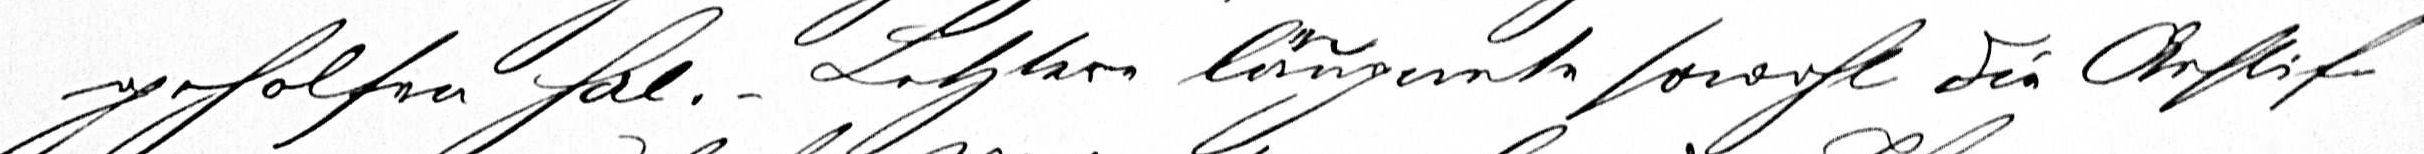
geholfen hat. Letztere läugnete sowohl die Anstif¬
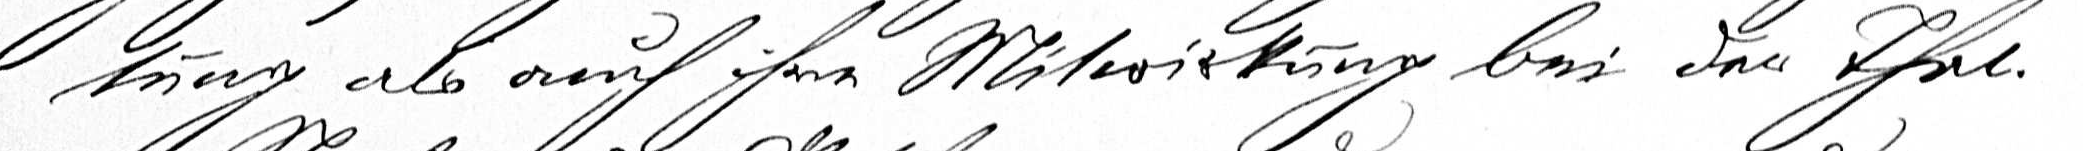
tung als auch ihre Mitwirkung bei der That.
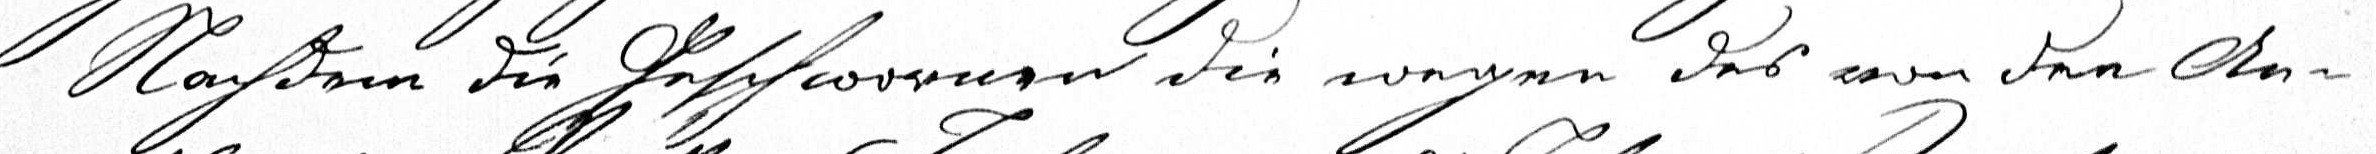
Nachdem die Geschorene die wegen des von dn An¬
